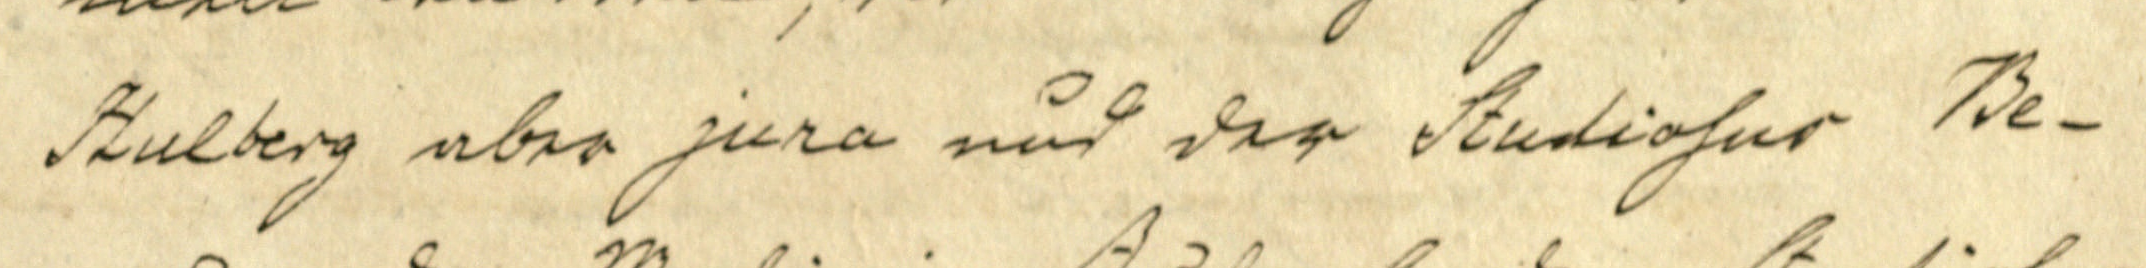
Hulberg aber jura und der Studiosus Be¬
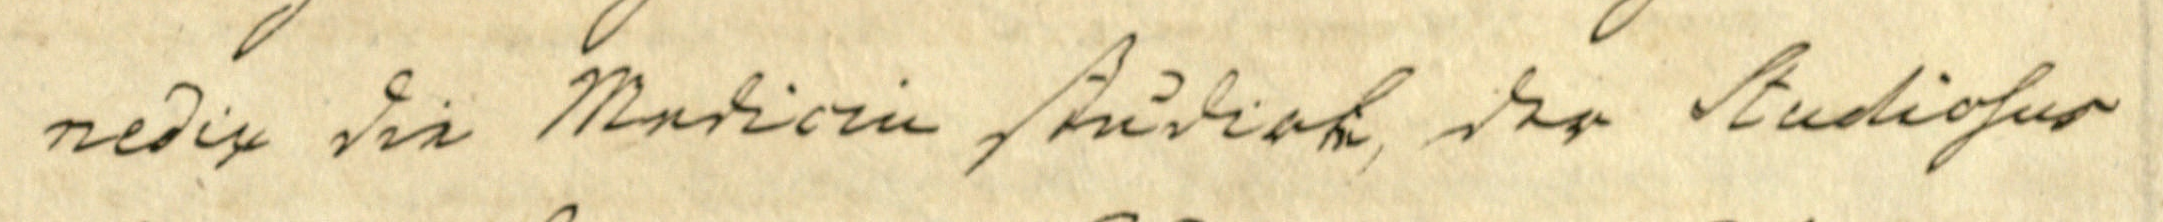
nedix die Medicin studirte, der Studiosus
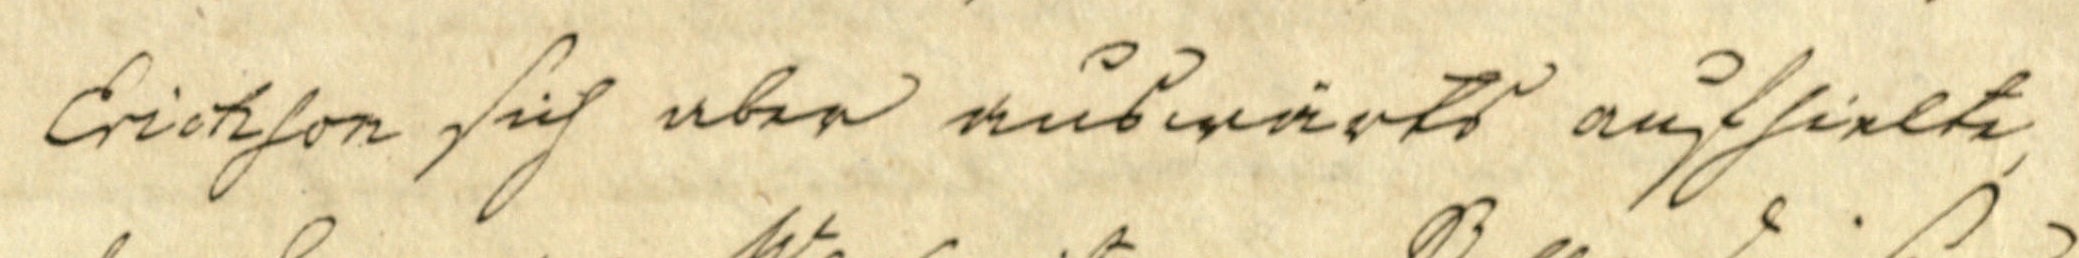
Erichson sich aber auswärts aufhielte,
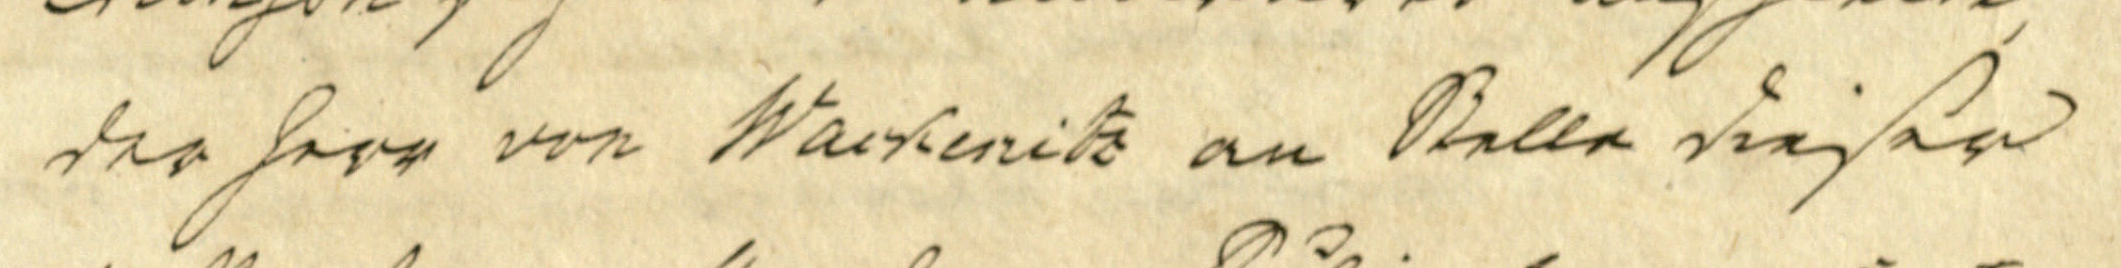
der Herr von Wackenitz an Stelle dieser
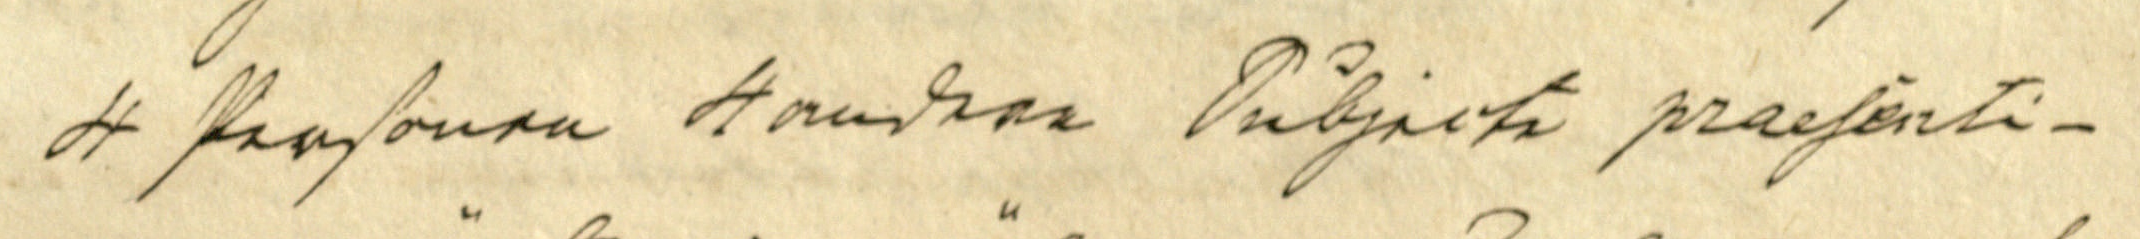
4 Personen 4 andere Subjecte paesenti-
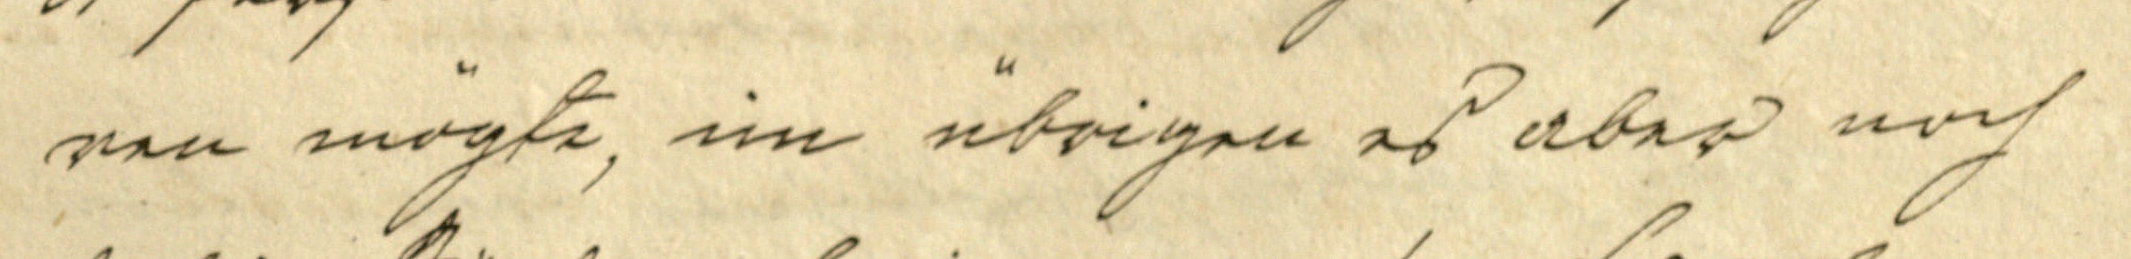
ren mögte, im übrigen es aber noch
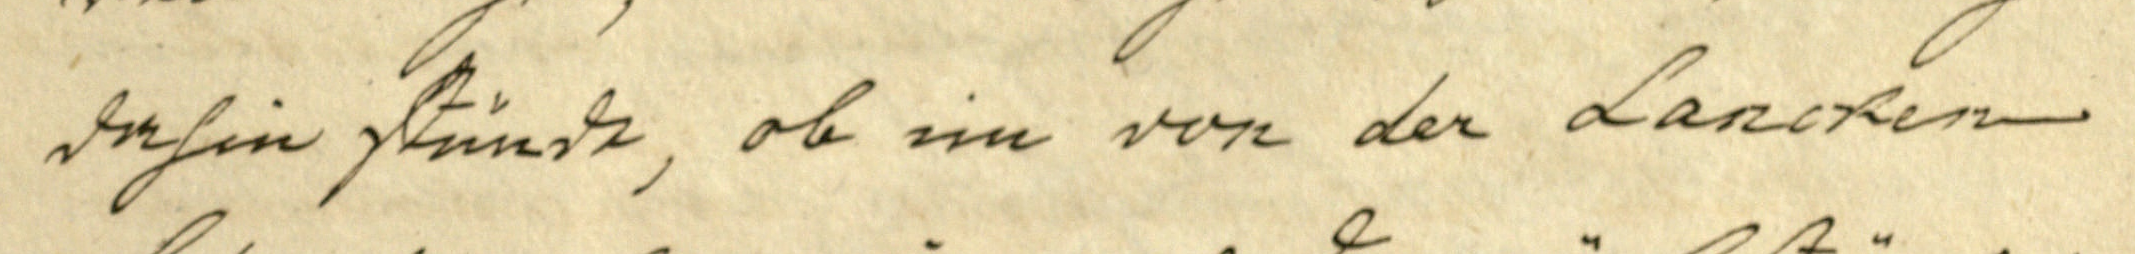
dahin stünde, ob im von der Lancken
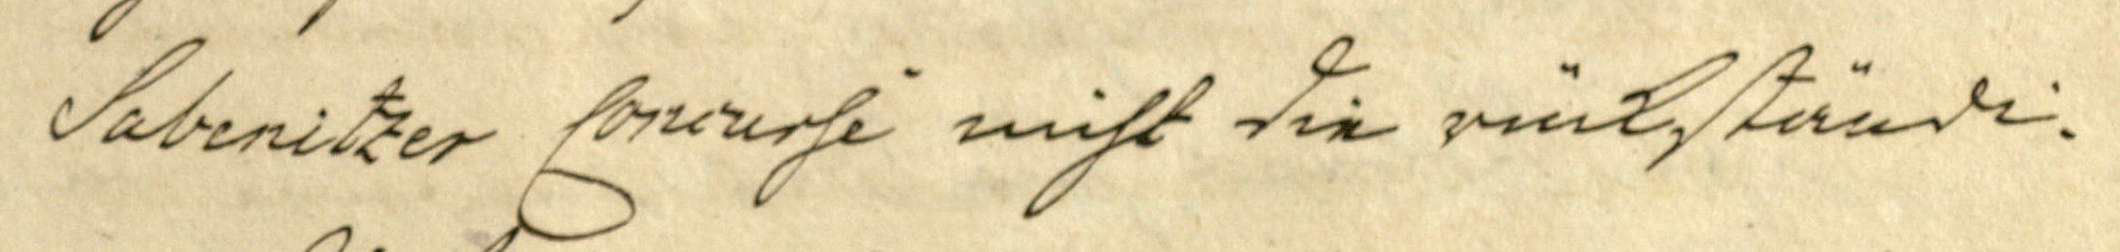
Sabenitzer Concurse nicht die rückständi¬
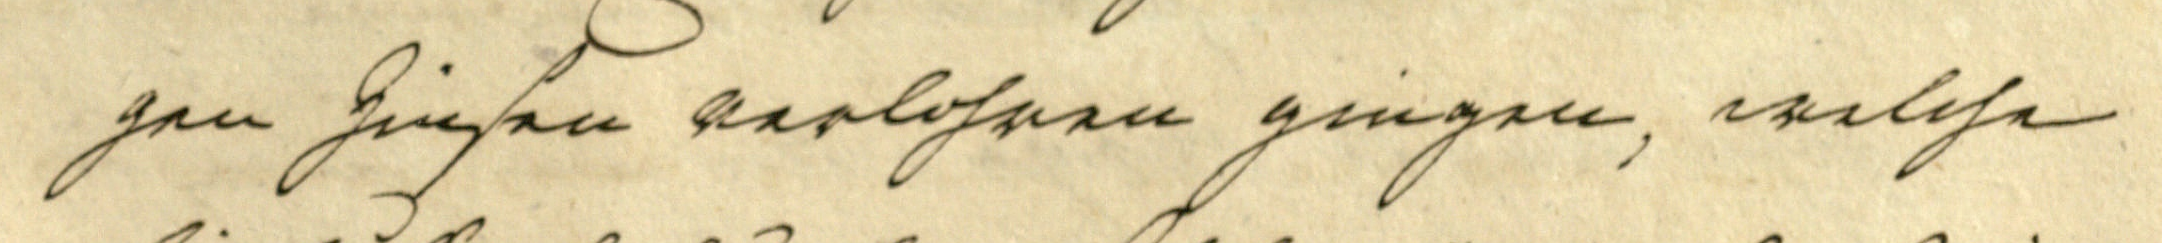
gen Zinsen verlohren gingen, welche
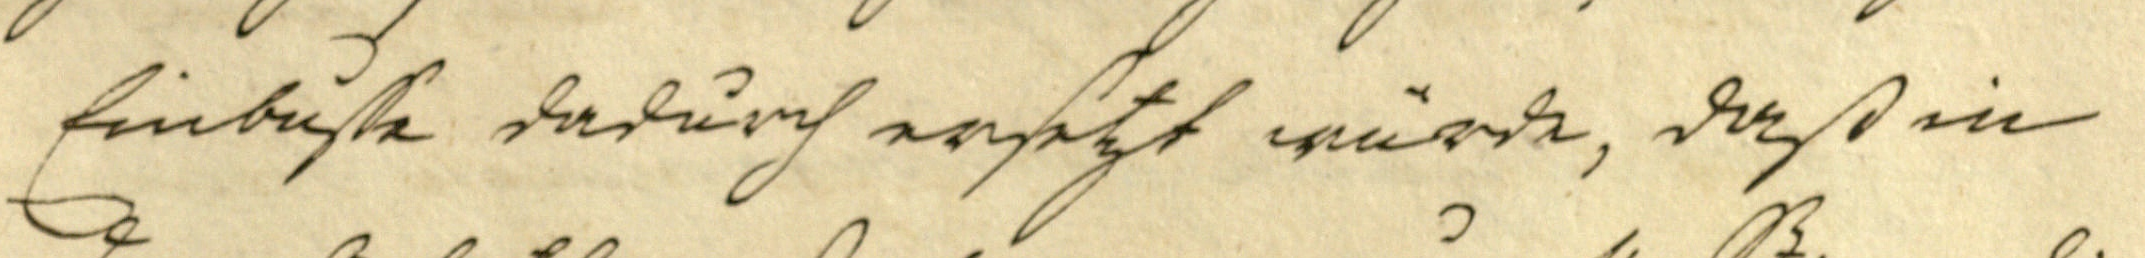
Einbusse dadurch ersetzt würde, daß in
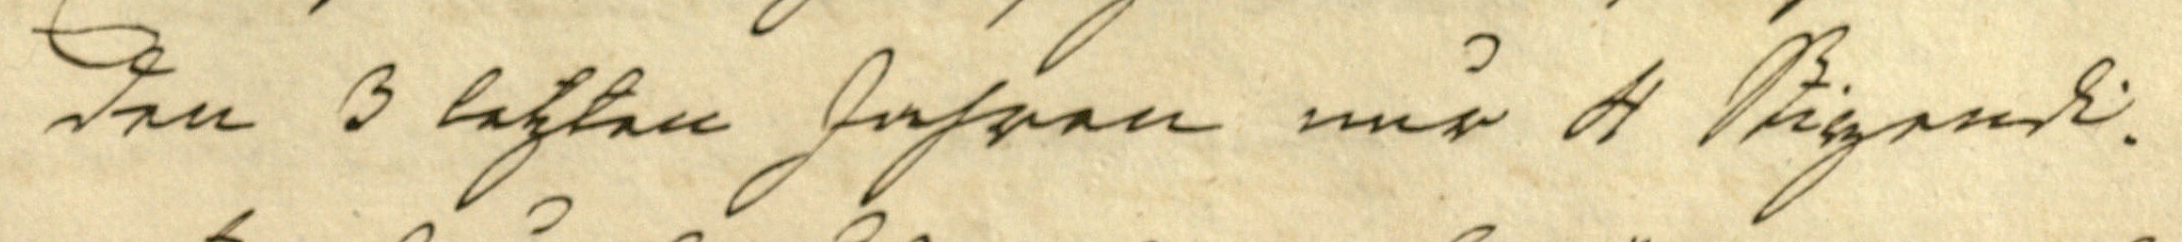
den 3 letzten Jahren nur 4 Stipendi¬
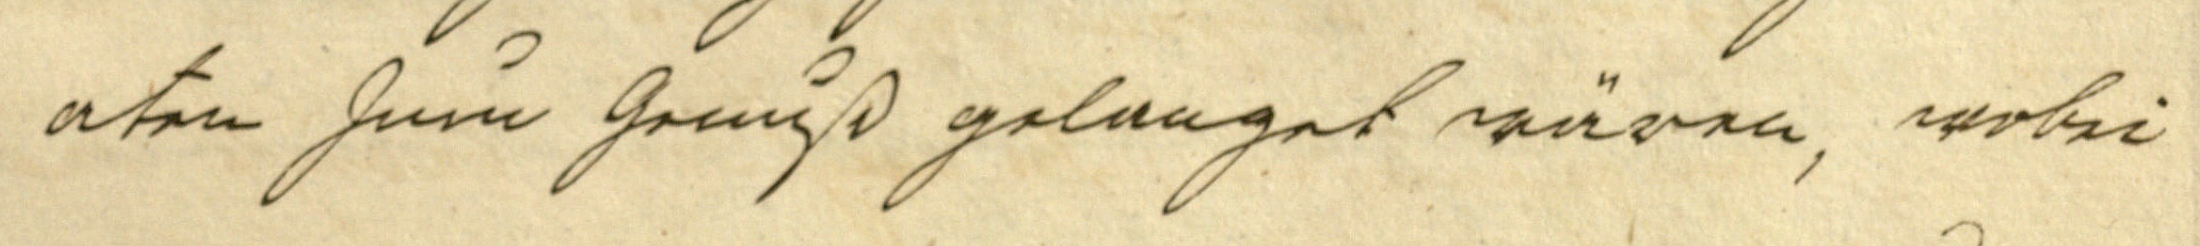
aten zum Genuß gelanget wären, wobei
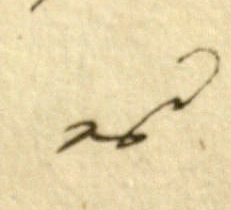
es
